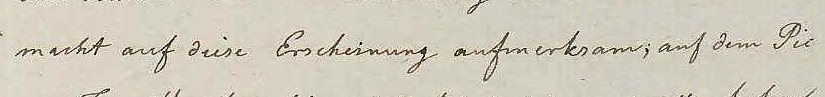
macht auf diese Erscheinung aufmerksam; auf dem Pic
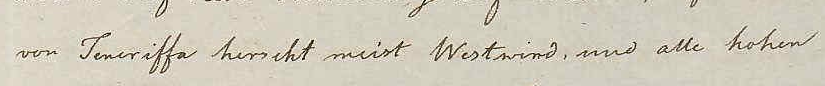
von Teneriffa herscht meist Westwind, und alle hohen
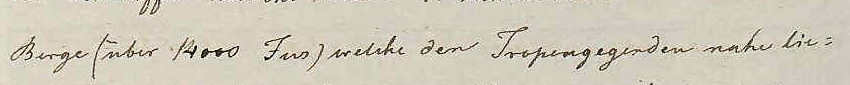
Berge welche den Tropengegenden nahe lie-
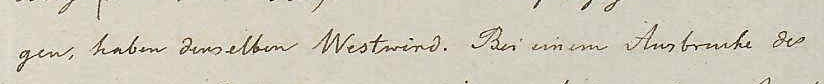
gen, haben denselben Westwind. Bei einem Ausbruche des
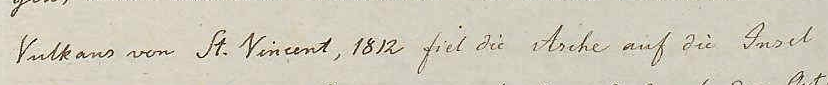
Vulkans von St. Vincent, 1812 fiel die Asche auf die Insel
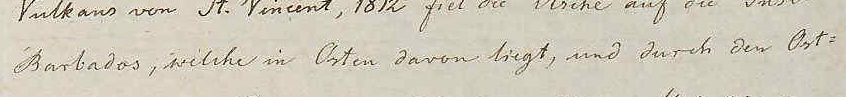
Barbados, welche Osten davon liegt, und durch den Ost-
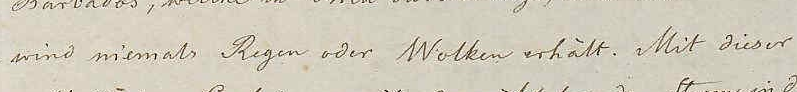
wind niemals Regen oder Wolken erhält. Mit dieser
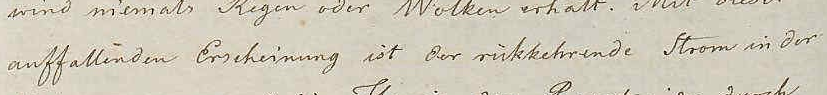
auffallenden Erscheinung ist der rükkehrende Strom in der
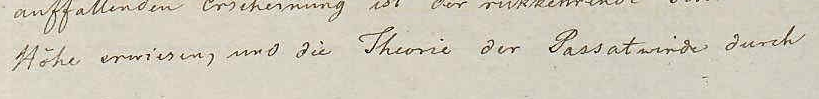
Höhe erwiesen, und die Theorie der Passatwinde durch
